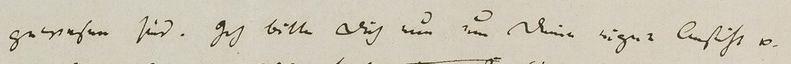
gewesen sind. Ich bitte Dich nun um Deine eigne Ansicht &.
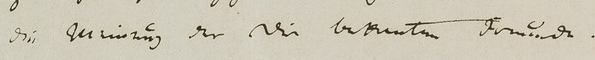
die Meinung der Dir bekannten Freunde.
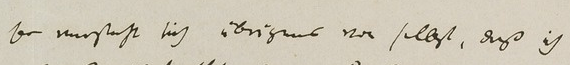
Es versteht sich übrigens von selbst, daß ich
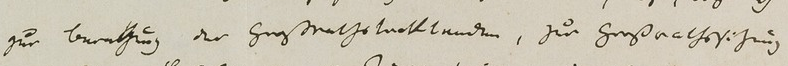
zur Berathung der Großrathstraktanden, zur Großrathssitzung
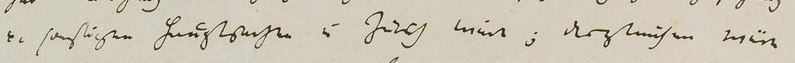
&. sonstigen Hauptsachen in Zürich wäre; desgleichen wäre
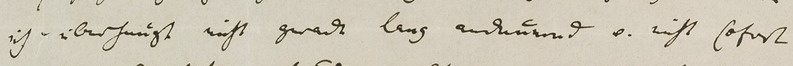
ich überhaupt nicht gerade lang andauernd &. nicht sofort
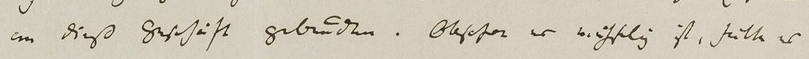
an dieß Geschäft gebunden. Obschon es mühselig ist, hätte es
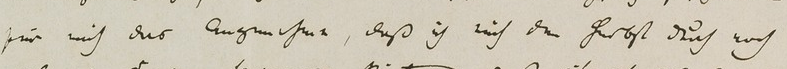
für mich das Angenehme, daß ich mich den Herbst durch noch
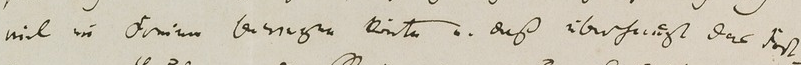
viel im Freien bewegen könnte &. daß überhaupt das Fort-
